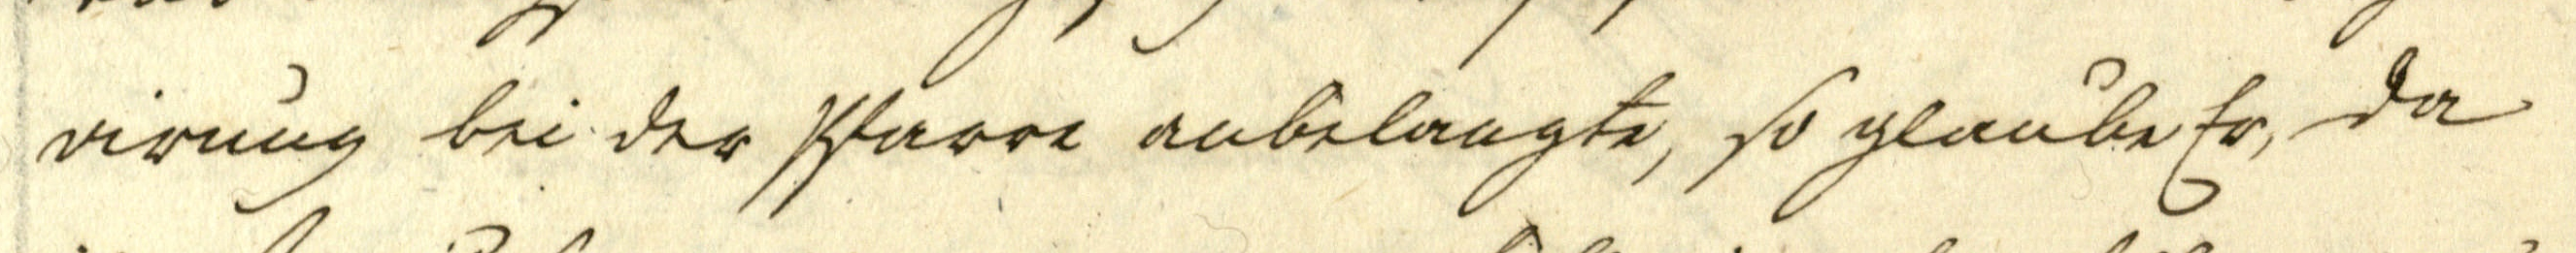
virung bei der Pfarre anbelangte, so glaubeEr, da
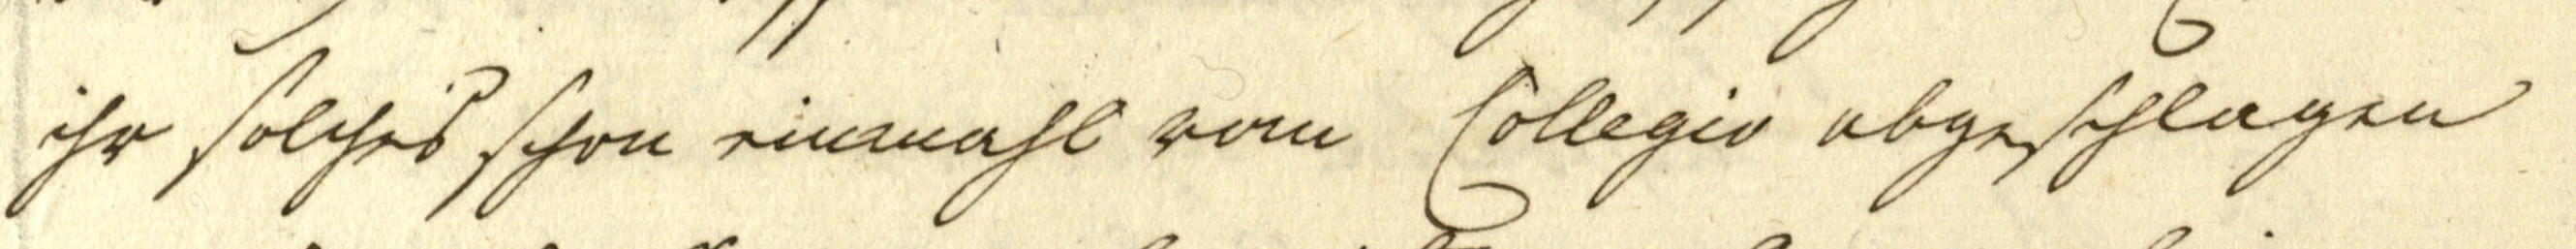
ihr solches schon einmahl vom Collegio abgeschlagen
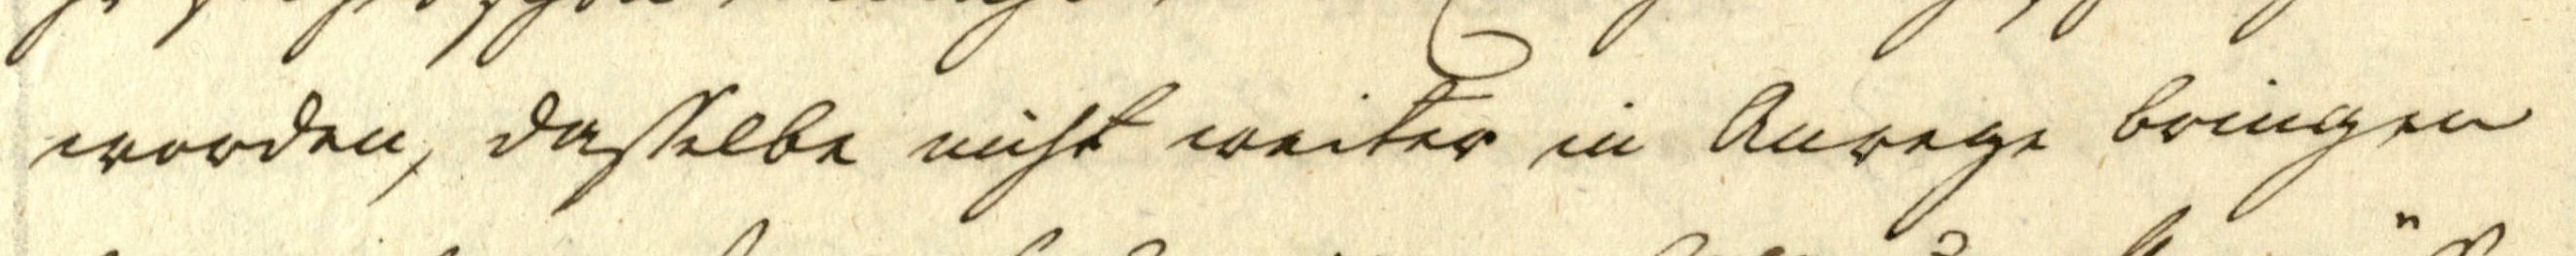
worden, dasselbe nicht weiter in Anrege bringen
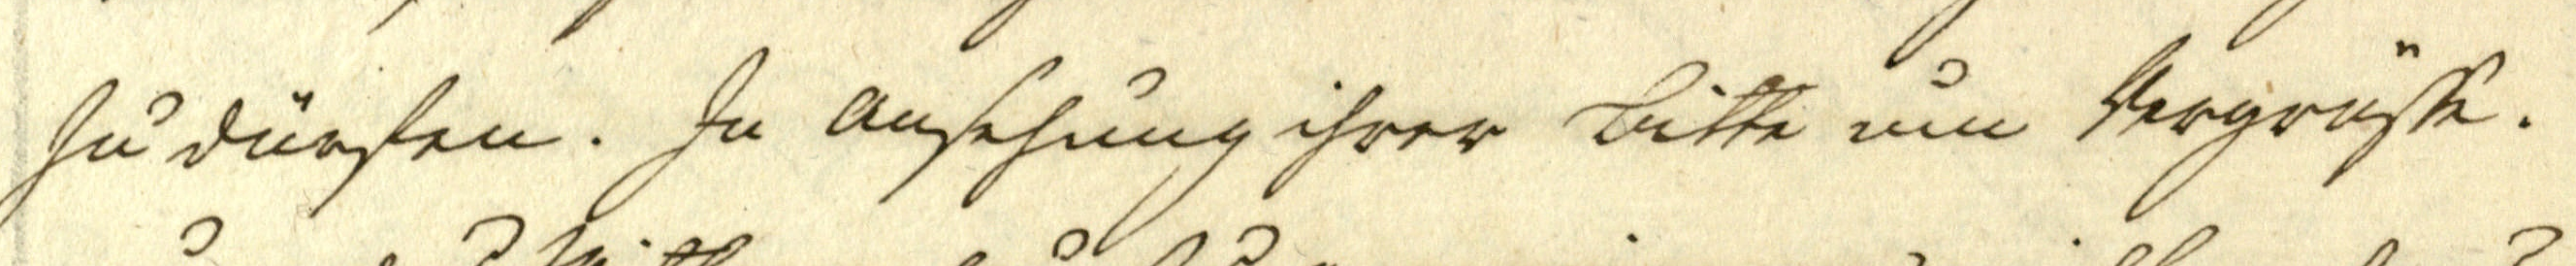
zu dürfen. In Ansehung ihrer Bitte um Vergrösse-
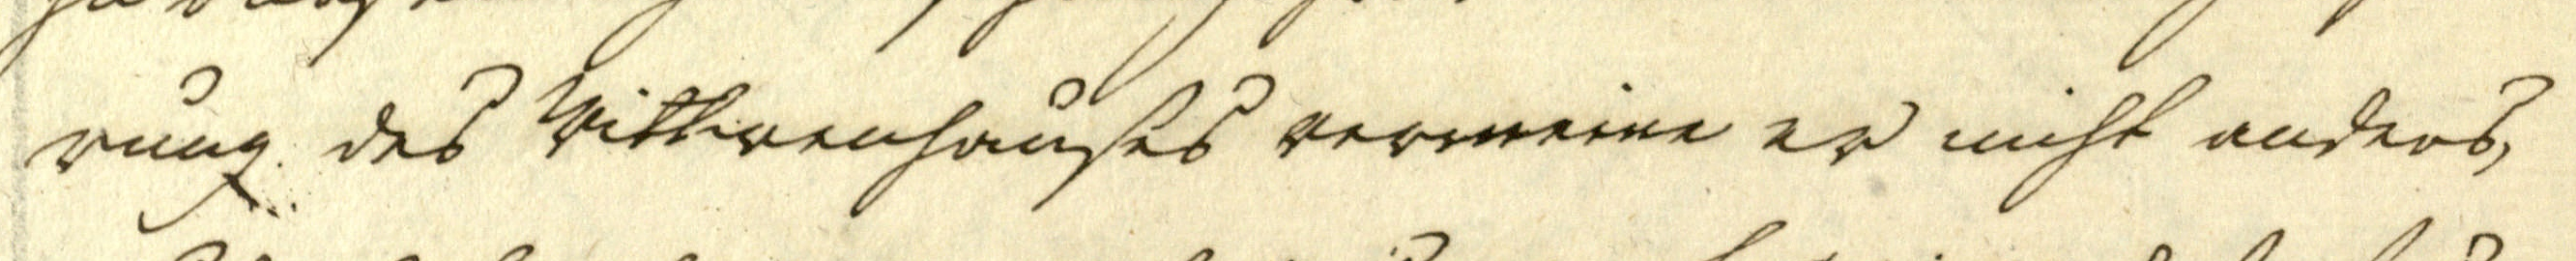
rung des Wittwenhauses vermeine er nicht anders,
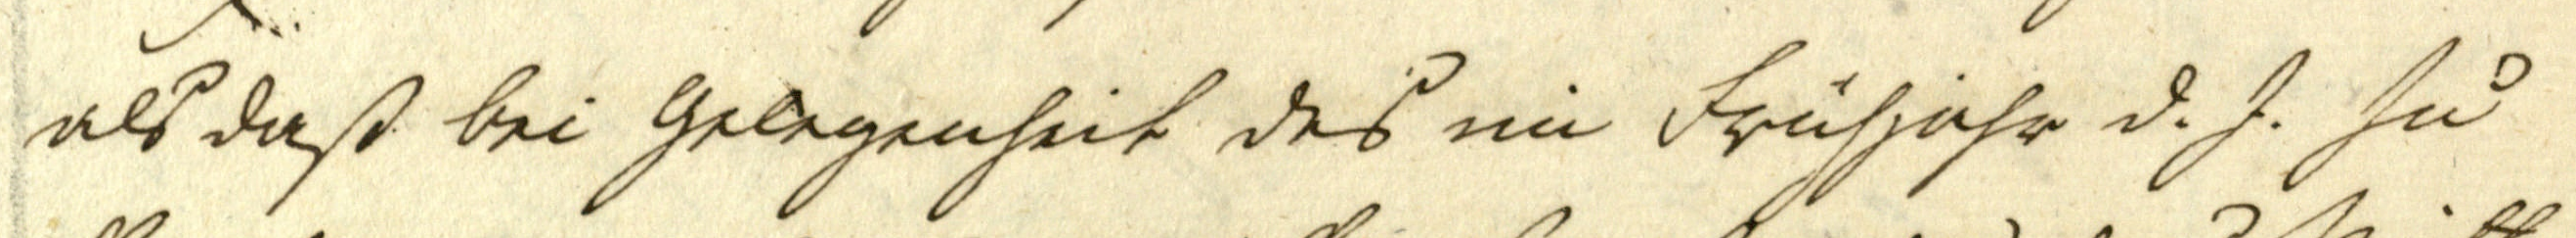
als daß bei Gelegenheit des im Frühjahr d. J. zu
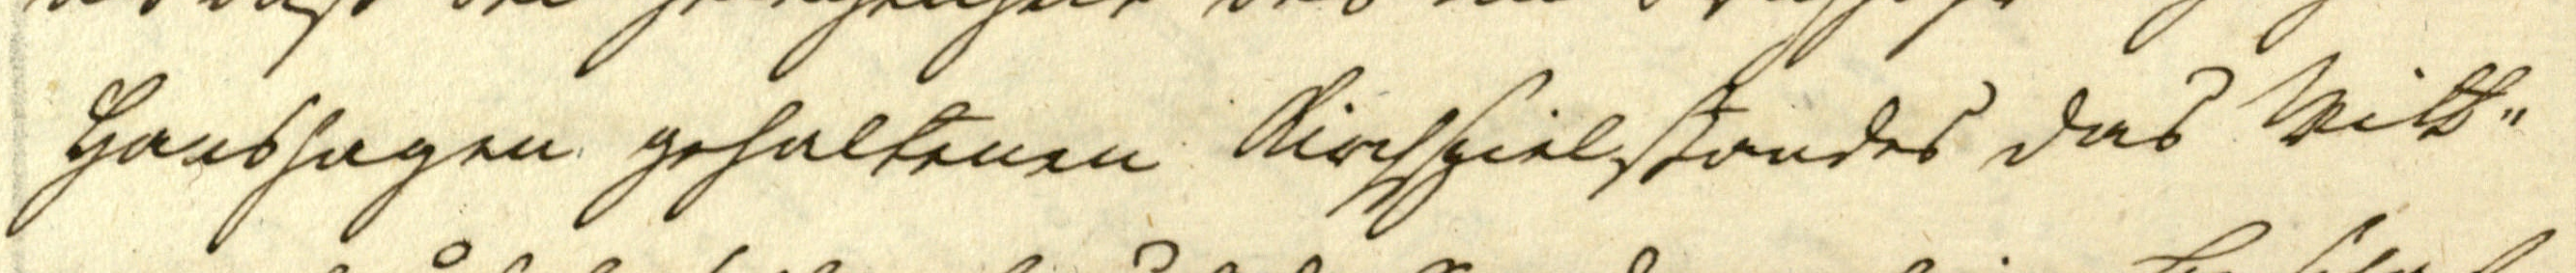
Hanshagen gehaltenen Kirchspielstandes das Witt¬
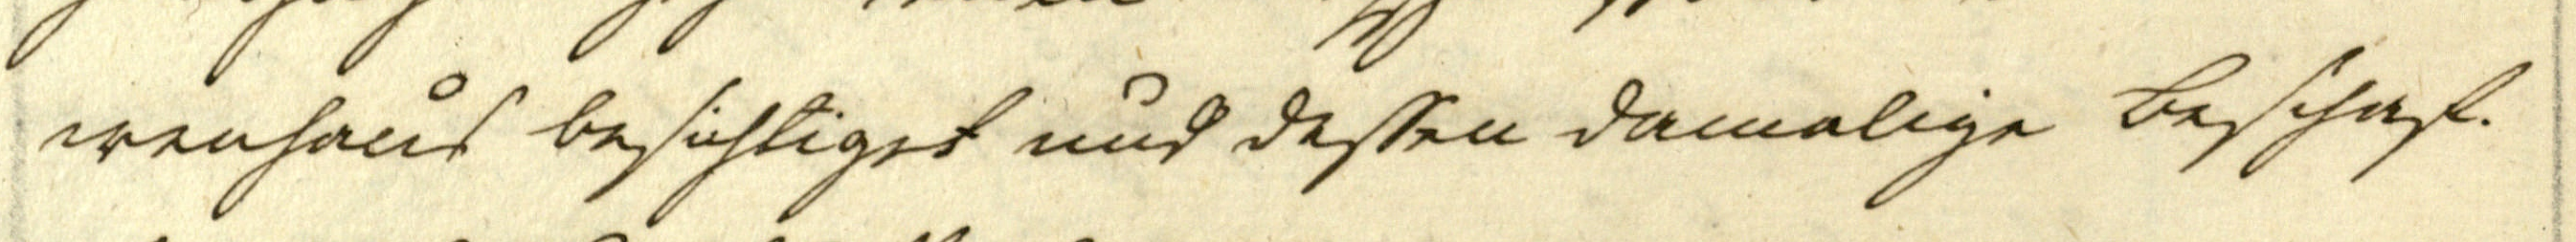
wenhaus besichtiget und dessen damalige Beschaf¬
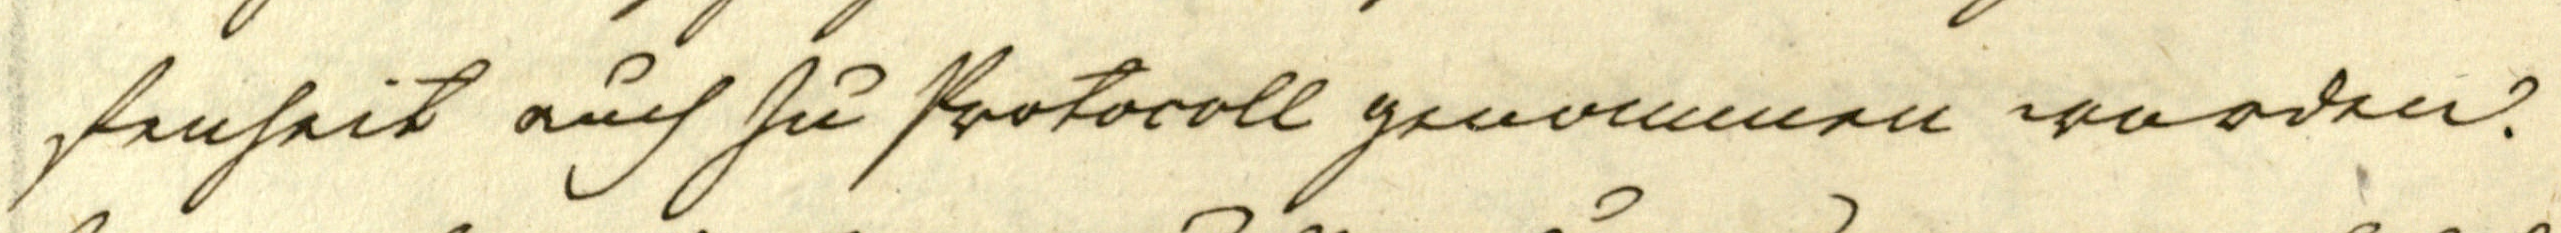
fenheit auch zu Protocoll genommen worden.
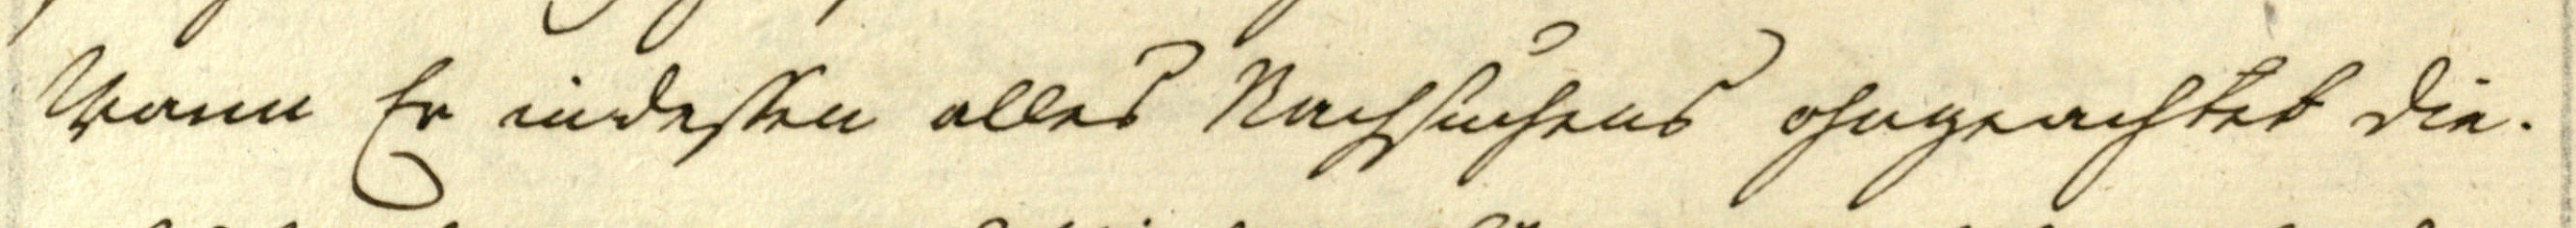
Wann Er indessen alles Nachsuchens ohngeachtet die¬
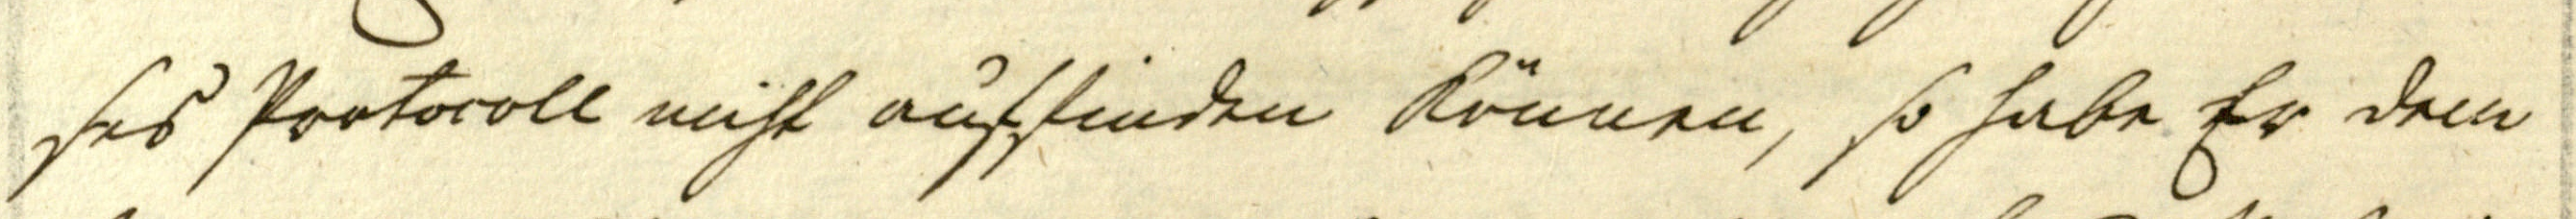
ses Protocoll nicht auffinden können, so habe Er dem
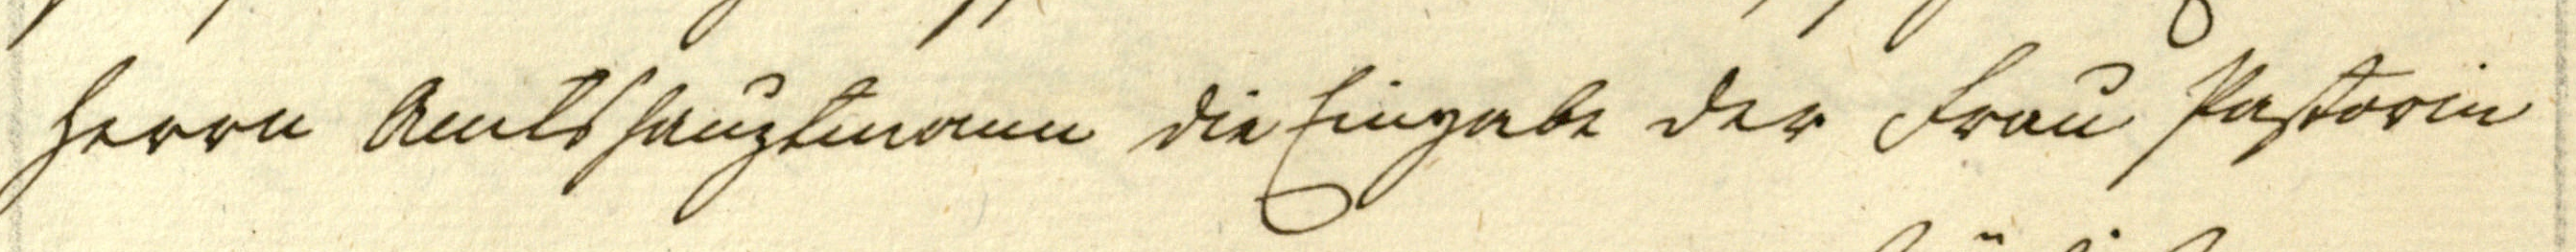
Herrn Amtshauptmann die Eingabe der Frau Pastorin
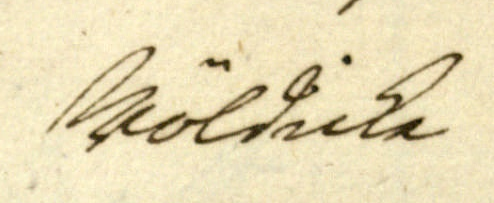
Wöldicke
